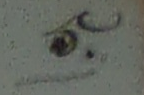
5.
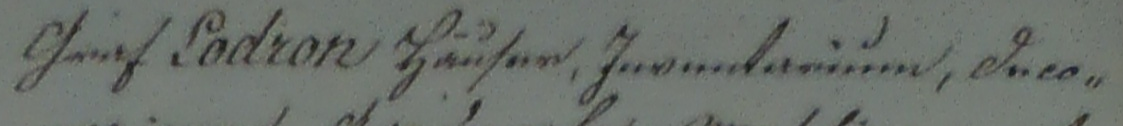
Graf Lodron Häuser, Inventarium, Deco¬
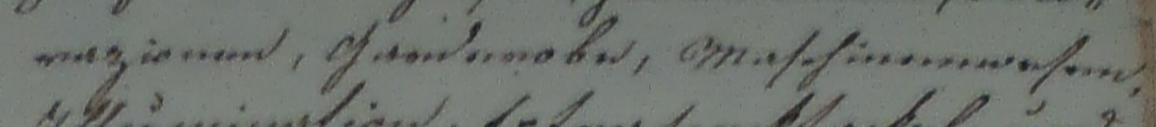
razionen, Garderobe, Maschinenwesen,
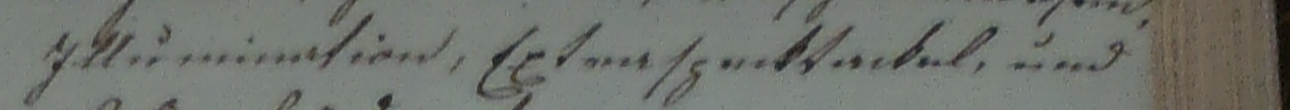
Illumination, Extraspektackel, und
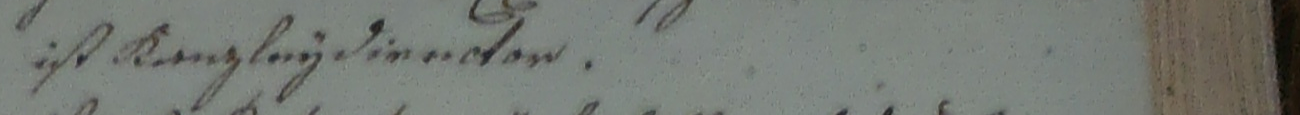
ist Kanzleidirector.
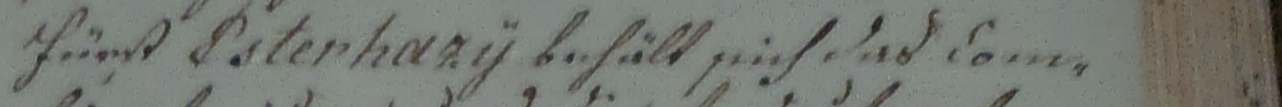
Fürst Esterhazy behält sich das Com¬
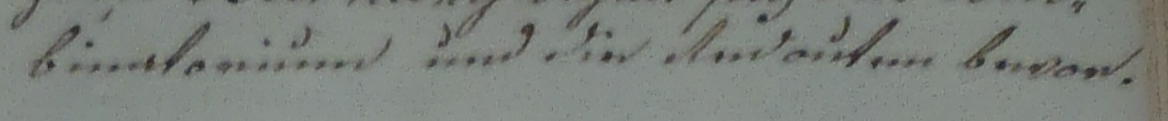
binatorium und die Redouten bevor.
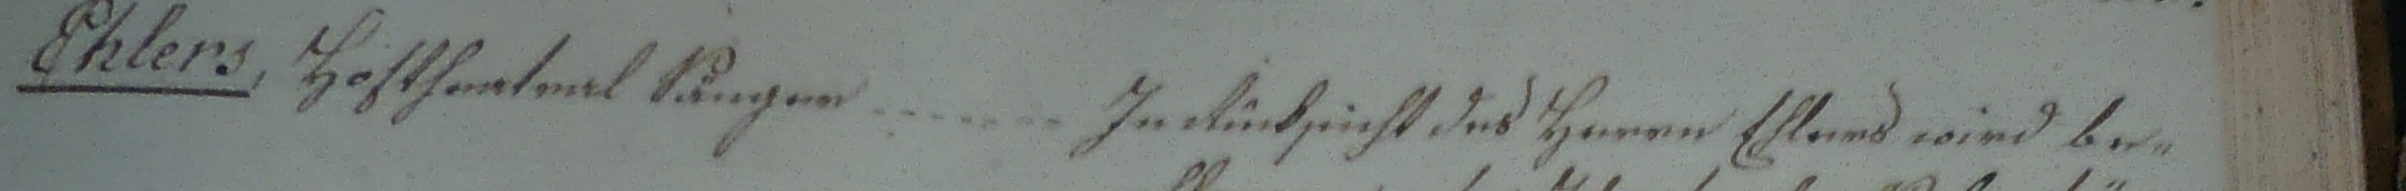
Ehlers, Hoftheatral Sänger ……. In Rücksicht des Herrn Ehlers wird be¬
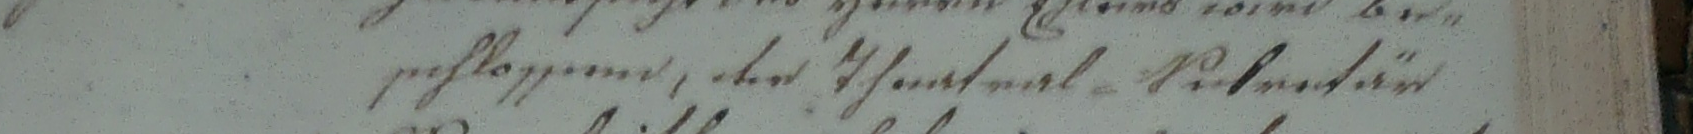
schlossen, der Theatral‗Sekretär
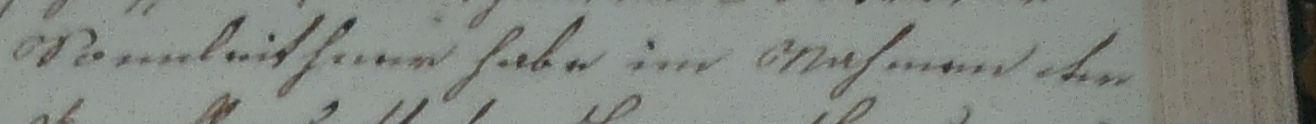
Sonnleithner habe im Nahmen der
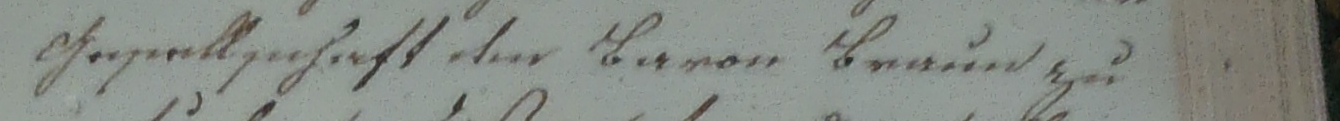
Gesellschaft den Baron Braun zu
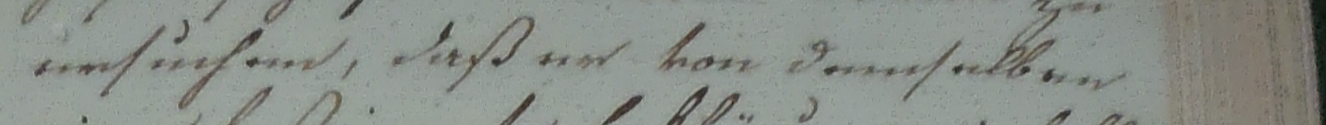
ersuchen, daß er von demselben
